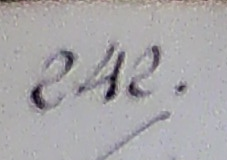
242.
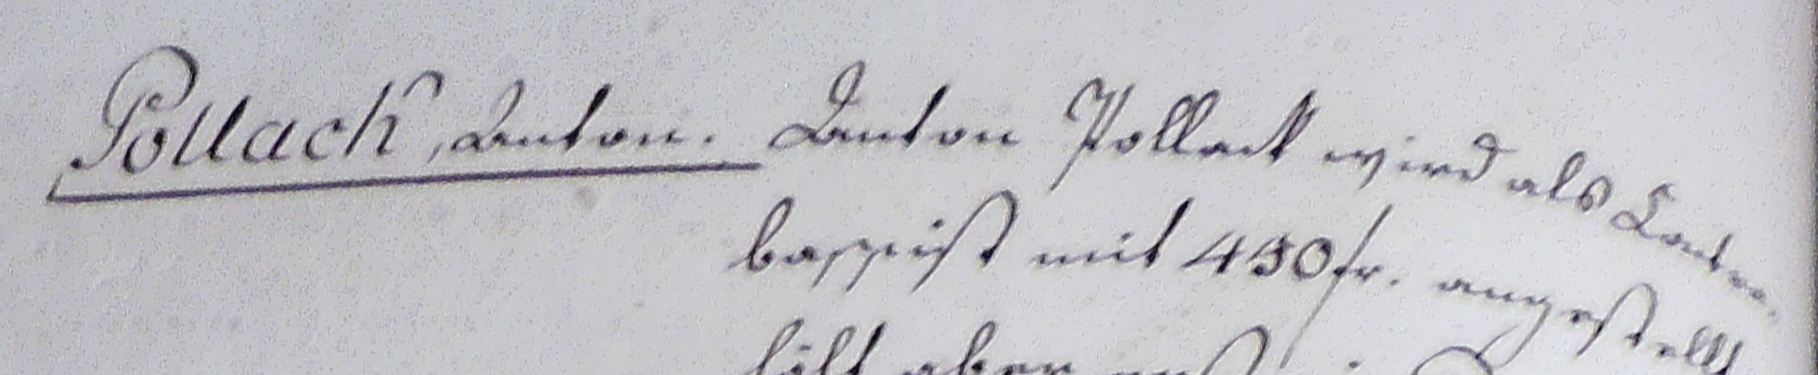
Pollack, Anton. Anton Pollack wird als Contra¬
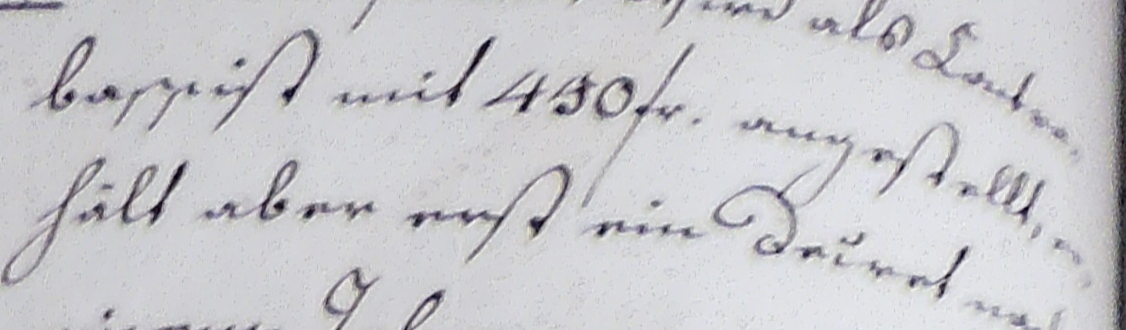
bassist mit 450fr. angestellt, er¬
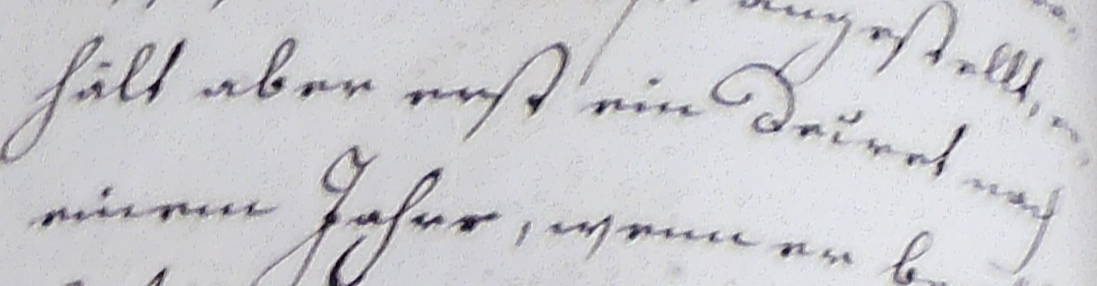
hält aber erst ein Decret nach
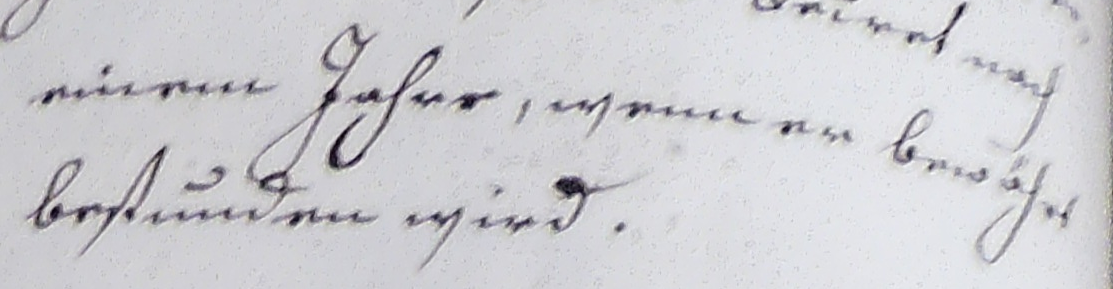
einem Jahr, wenn er bewährt
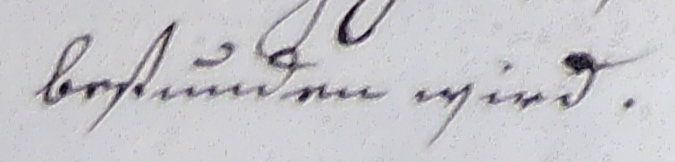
befunden wird.
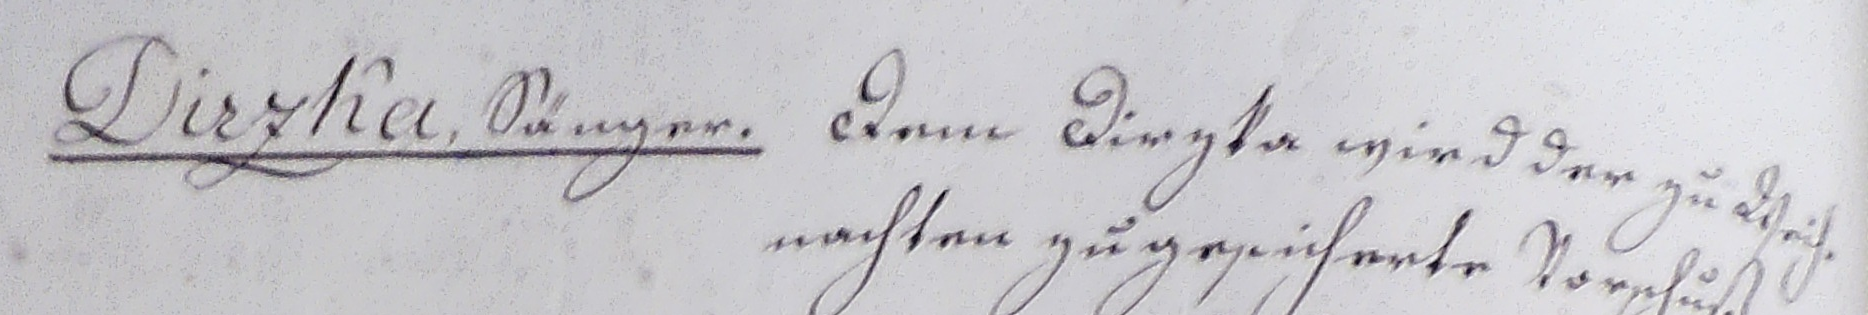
Dirzka, Sänger. Dem Dirzka wird der zu Weih¬
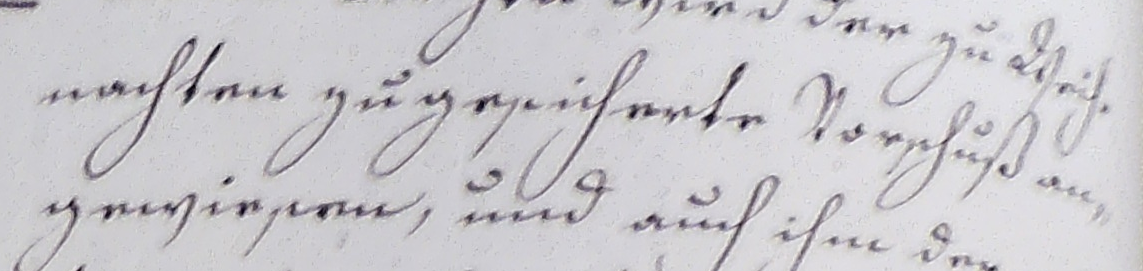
nachten zugesicherte Vorschuß an¬
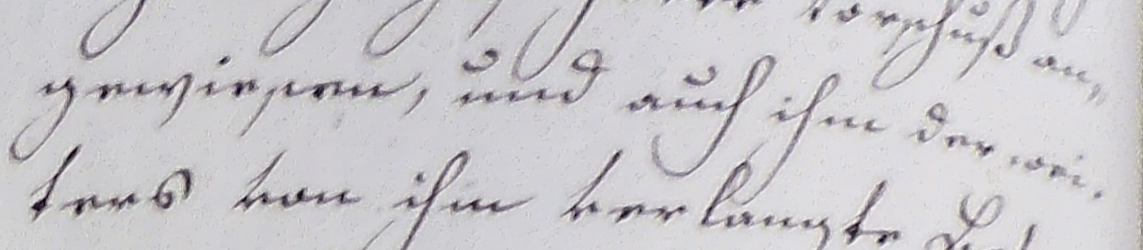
gewiesen, und auch ihm der wei¬
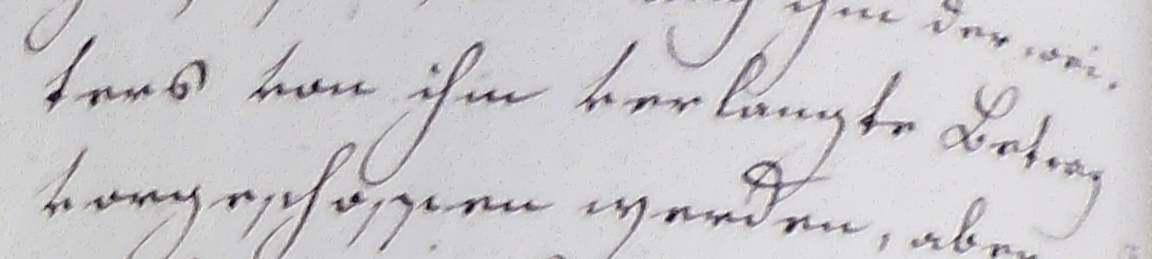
ters von ihm verlängte Betrag
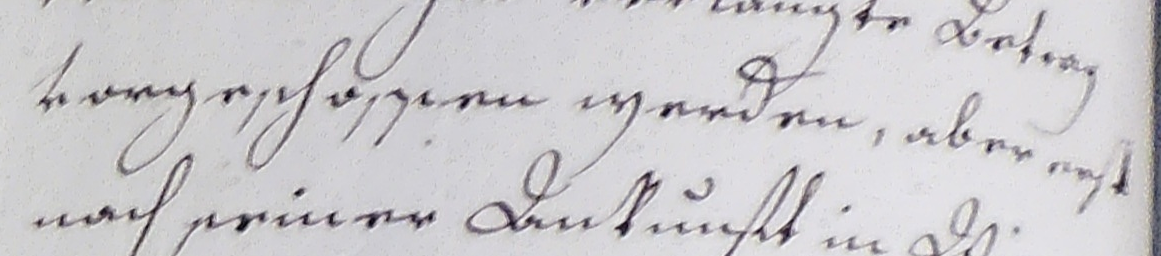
vorgeschossen werden, aber erst
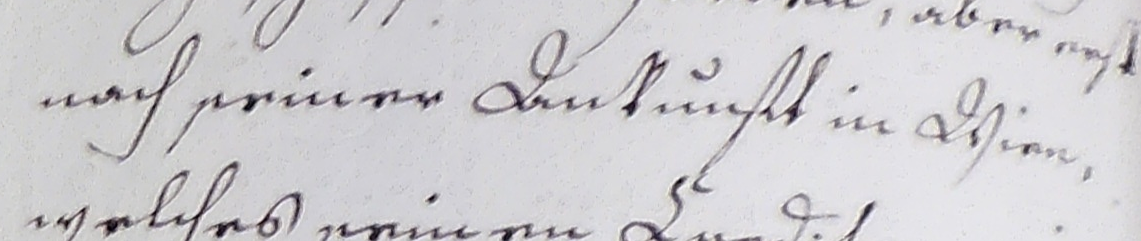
nach seiner Ankunft in Wien,
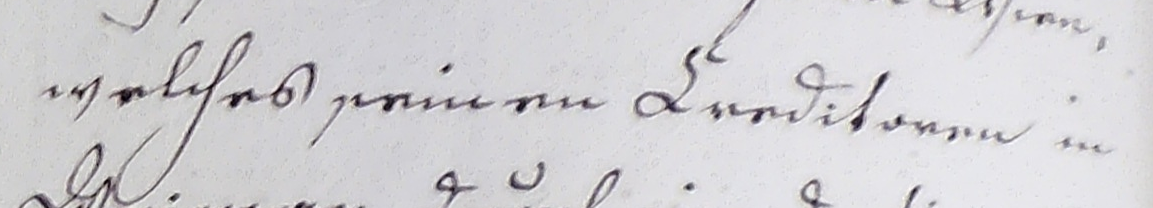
welches seinen Creditoren in
